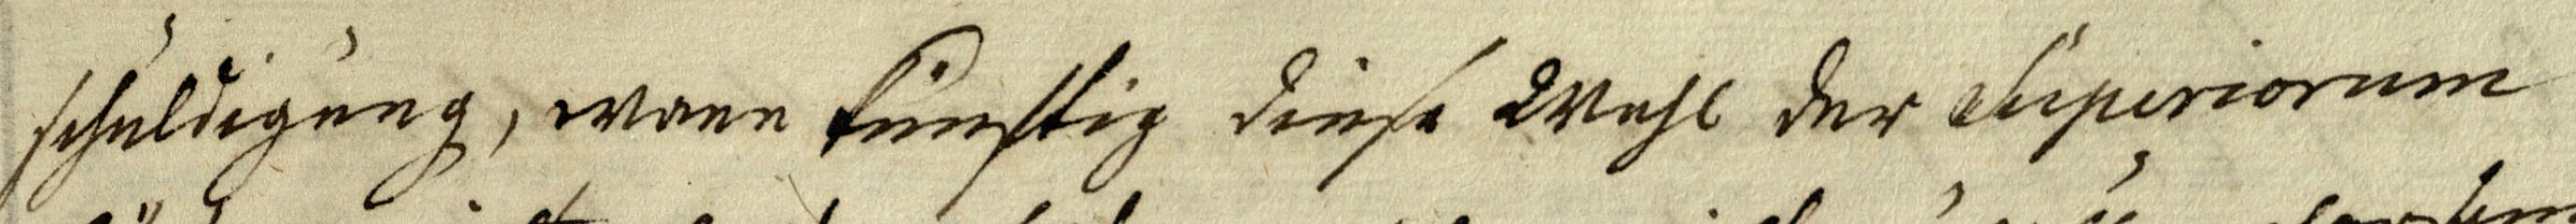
schuldigung, wann künftig diese Wahl der Superiorum
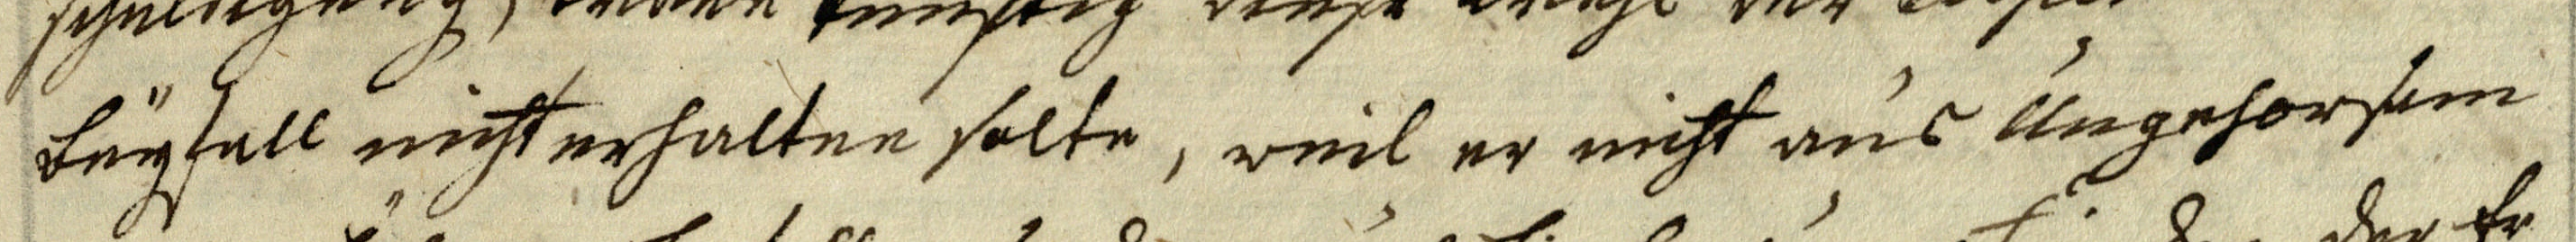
Beÿfall nicht erhalten solte, weil er nicht aus Ungehorsam
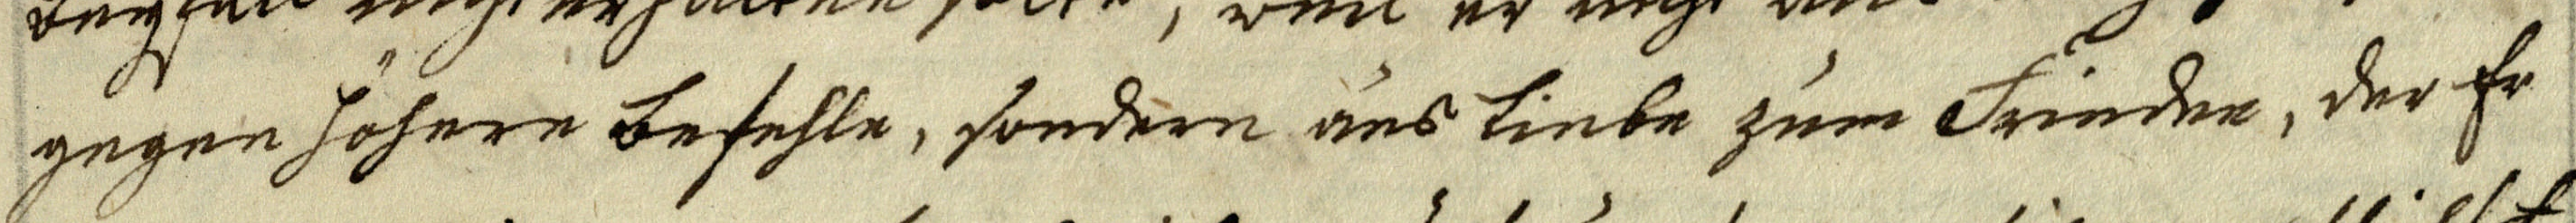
gegen höhere Befehle, sondern aus Liebe zum Frieden, der Er
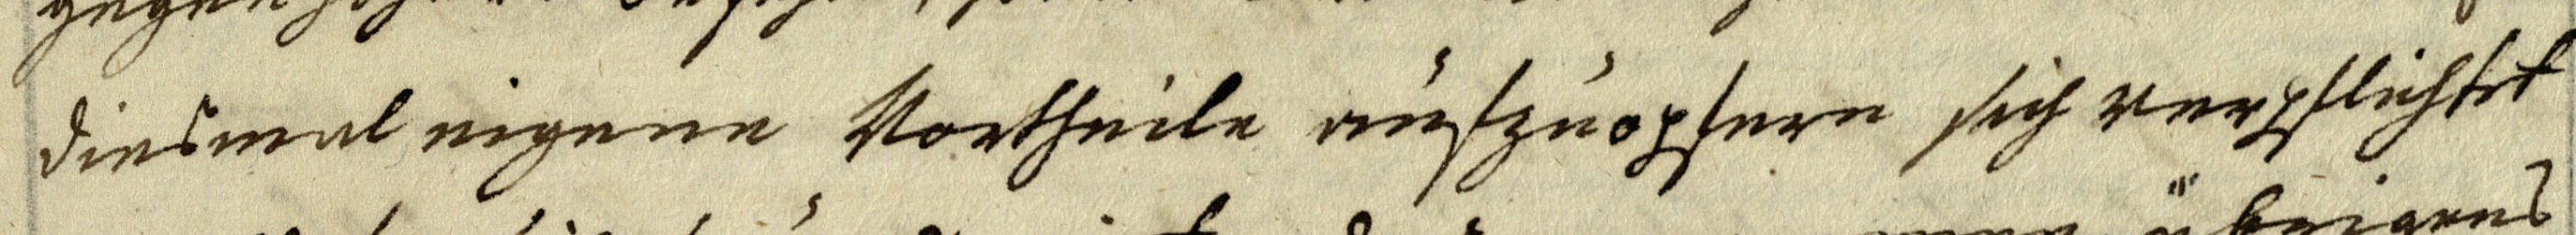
diesmal eigene Vortheile aufzuopfern sich verpflichtet
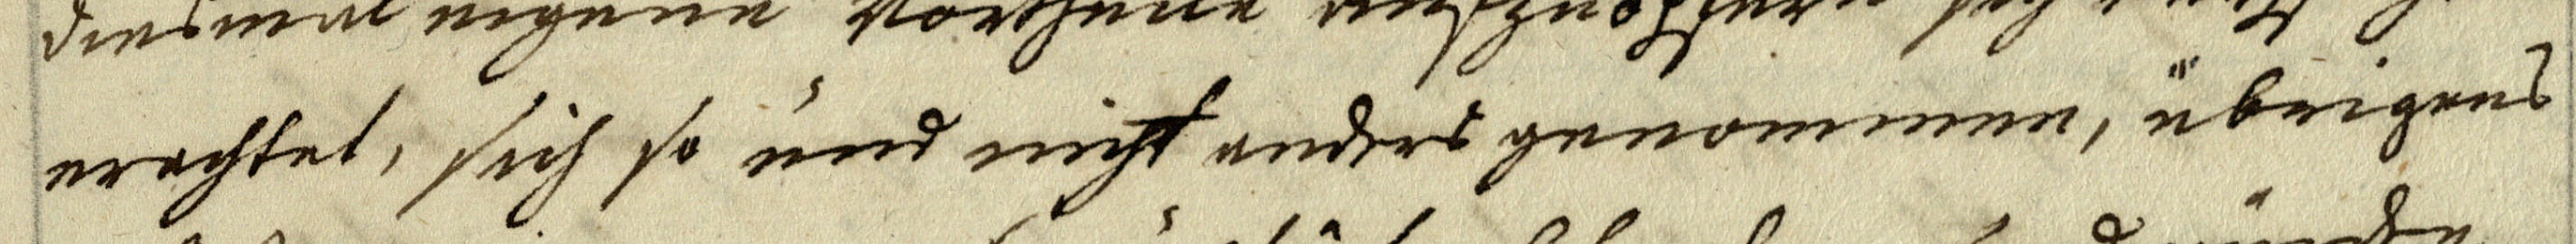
erachtet, sich so und nicht anders genommen, übrigens
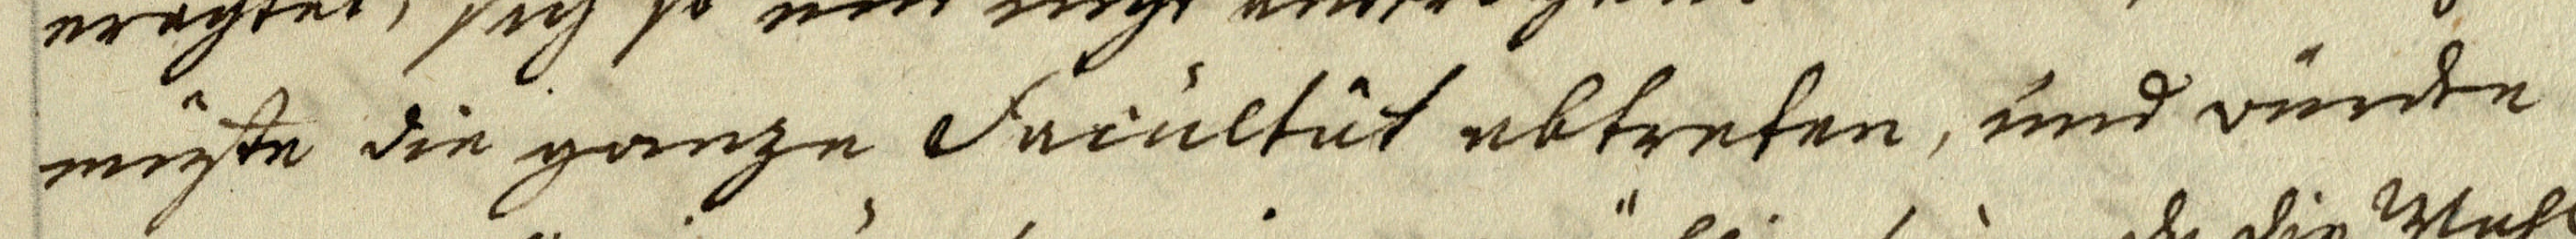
müste die ganze Facultät abtreten, und würden
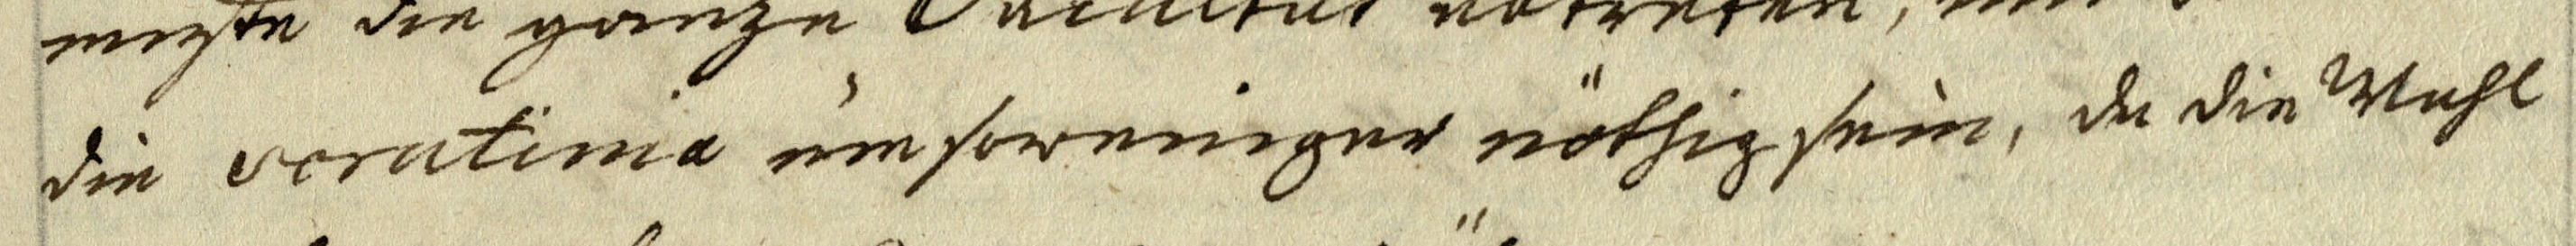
die scrutinia umsoweniger nöthig sein, da die Wahl
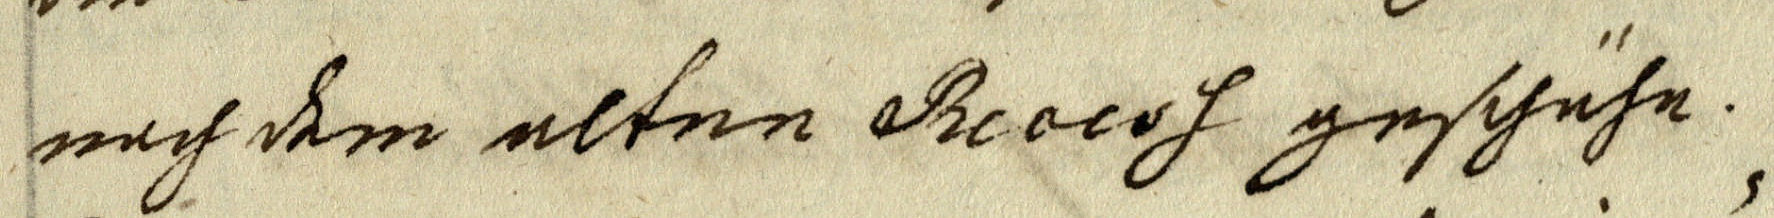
nach dem alten Recess geschähe.
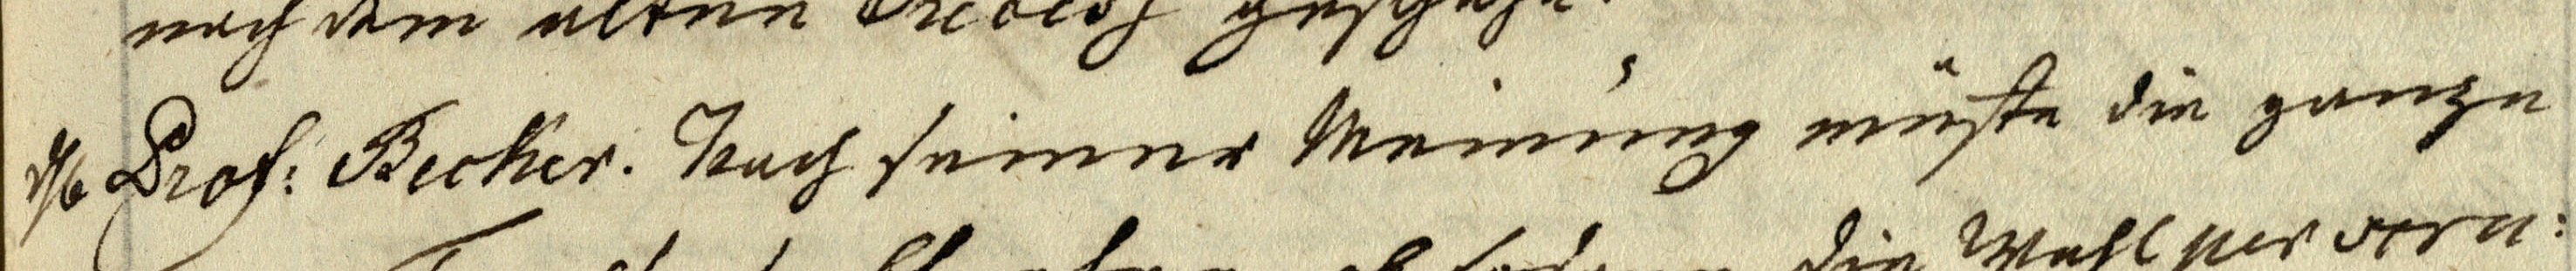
dh Prof. Becker. Nach seiner Meinung müste die ganze
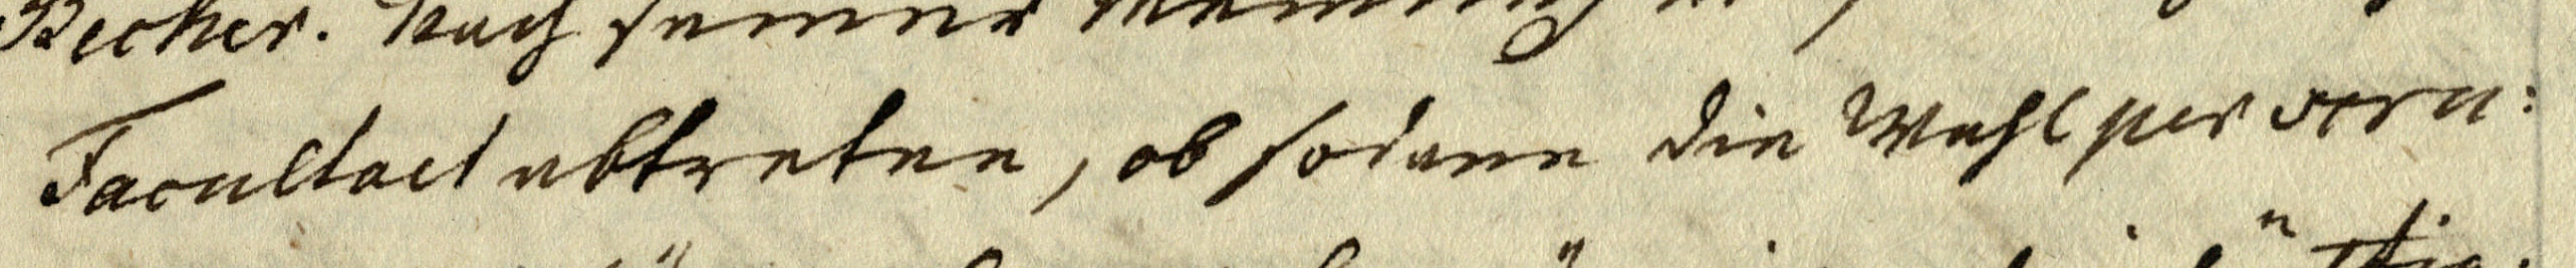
Facultaet abtreten, ob sodann die Wahl per scru¬
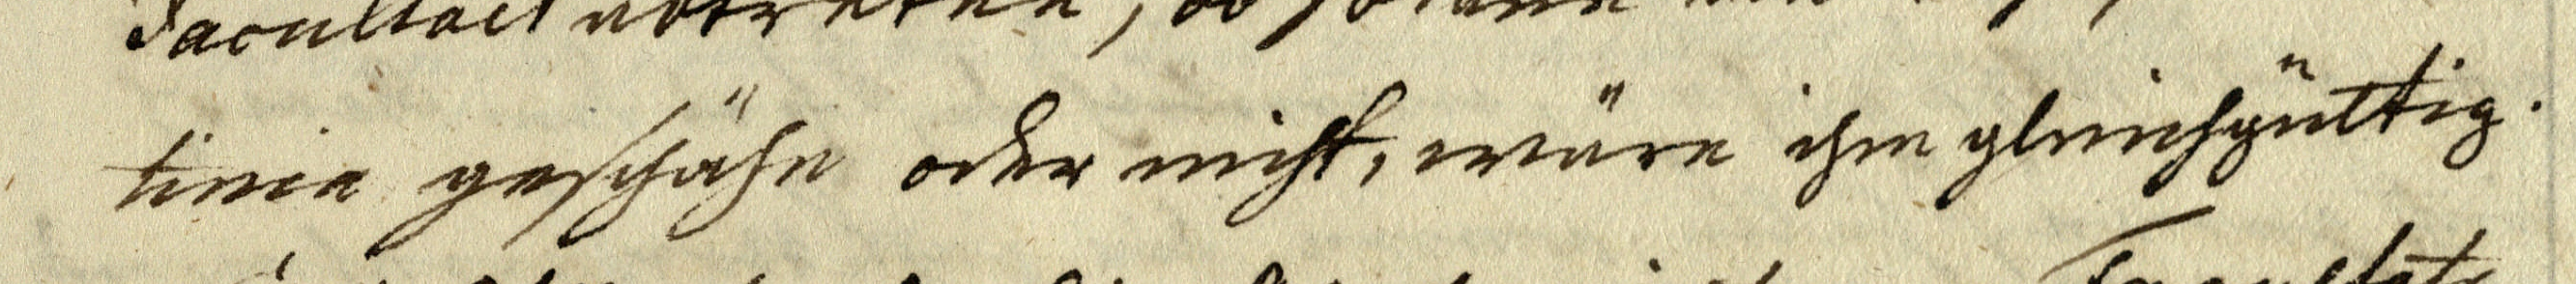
tinia geschähe oder nicht, wäre ihm gleichgültig.
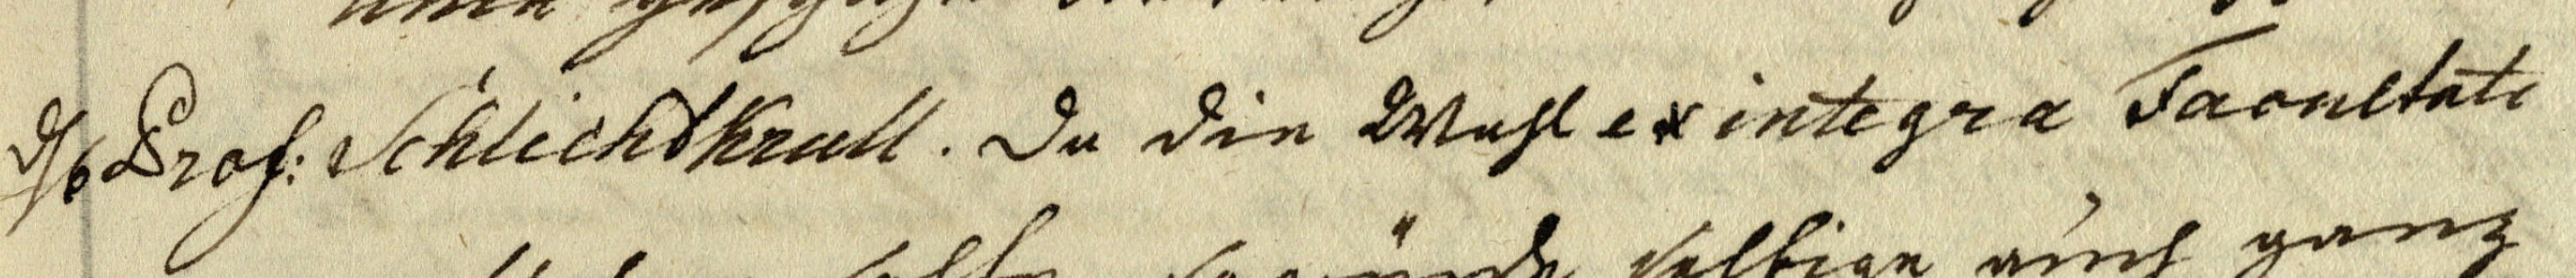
dh. Prof. Schlichtkrull. Da die Wahl ex integra Facultate
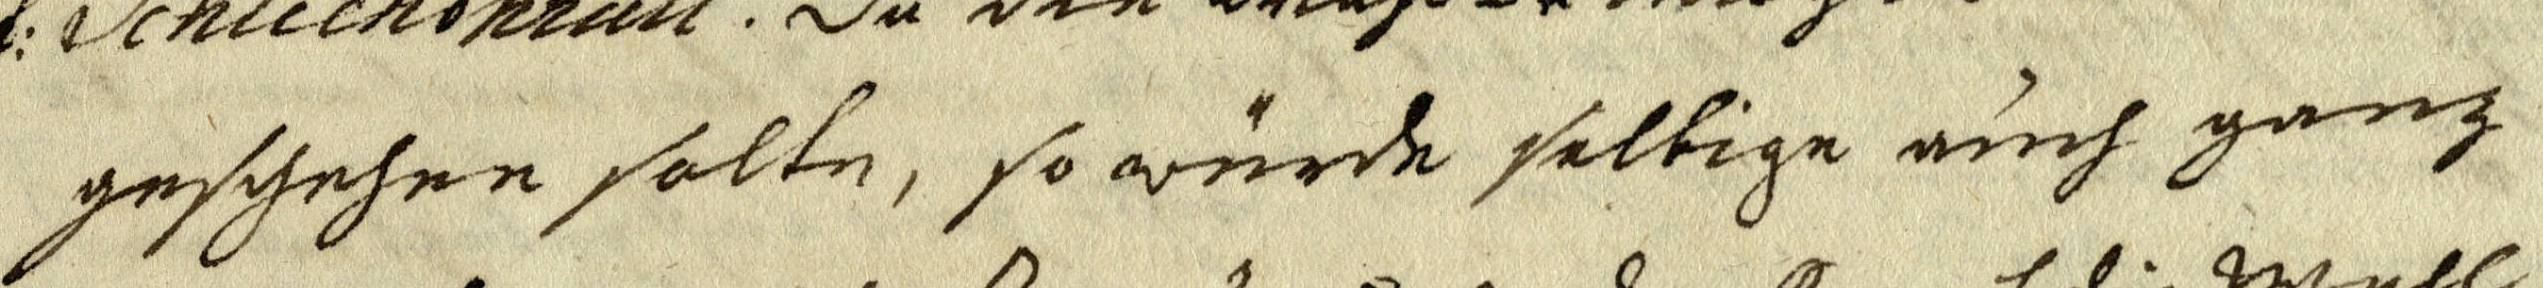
geschehen solte, so würde selbige auch ganz
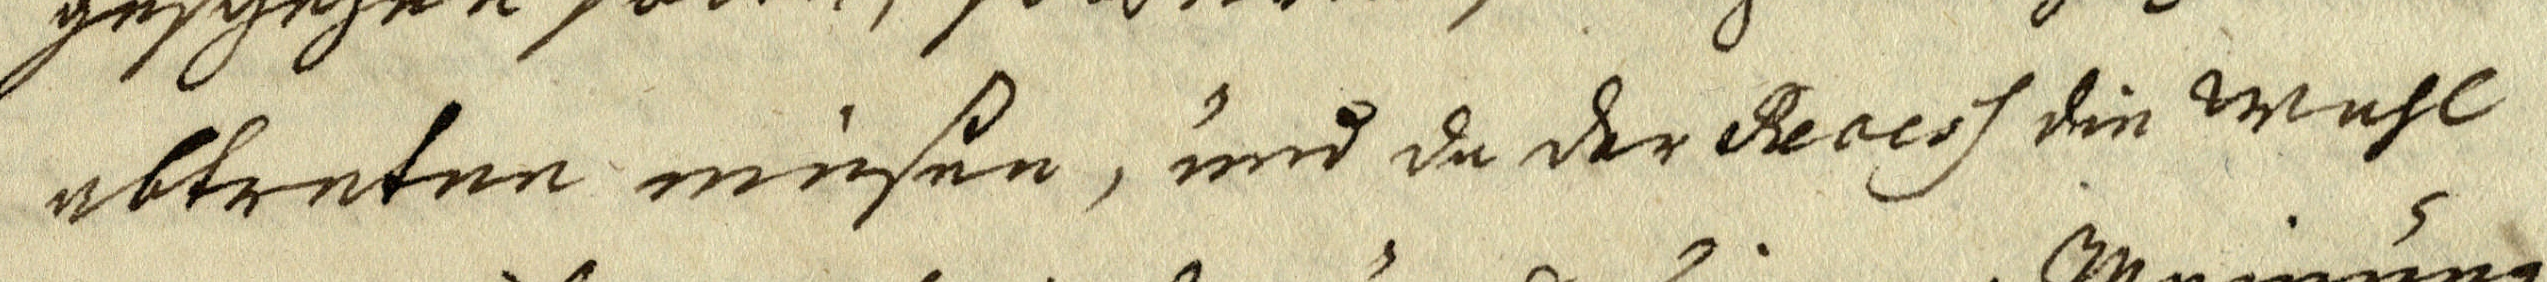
abtreten müßen, und da der Recess die Wahl
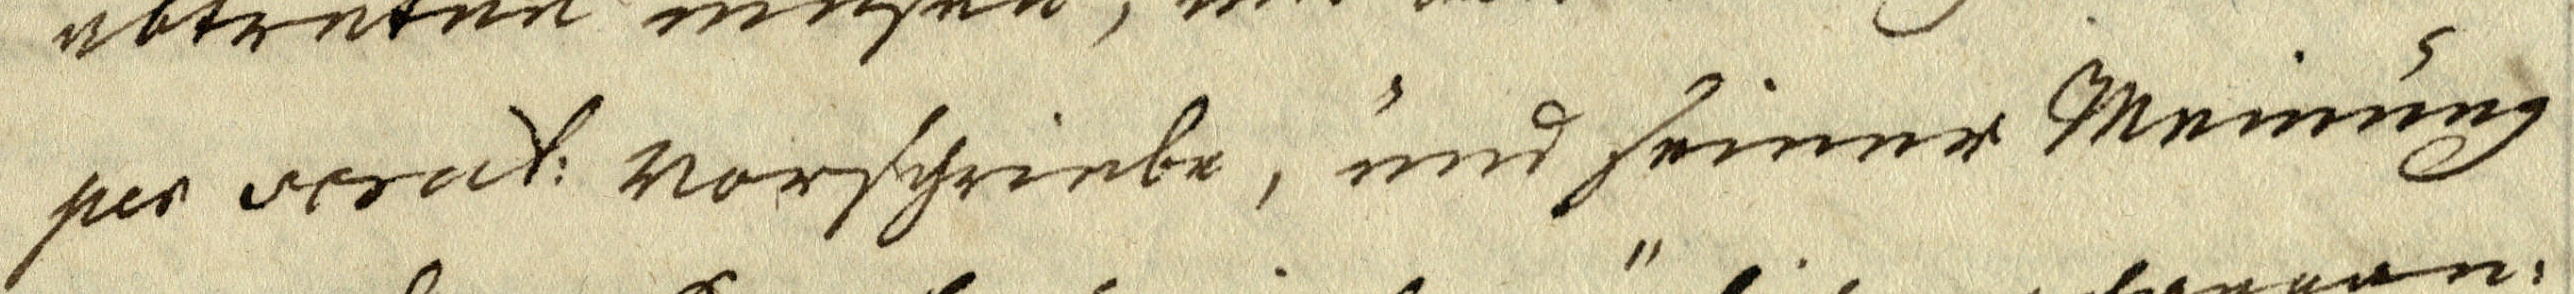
per scrut. vorschriebe, und seiner Meinung
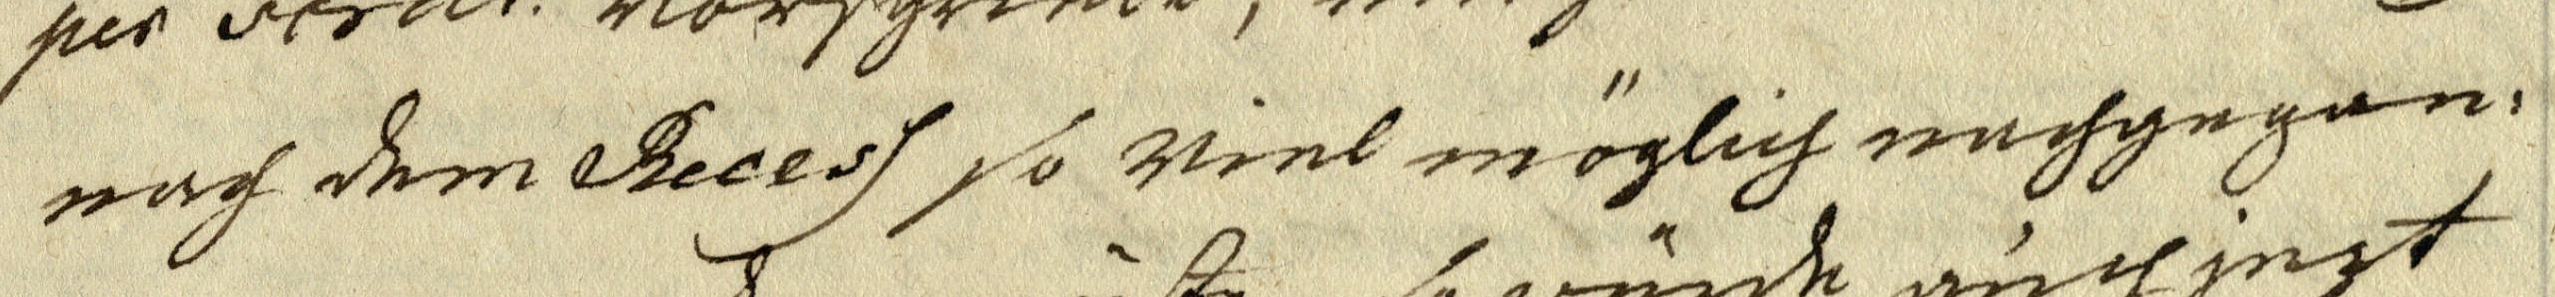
nach dem Recess so viel möglich nachgegang¬
